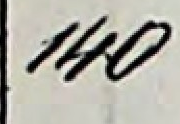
140
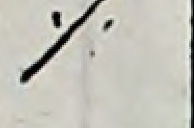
./.
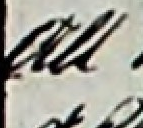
Alt
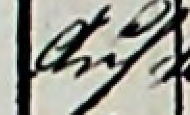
Aus„
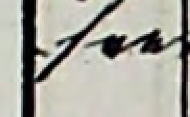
see
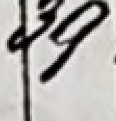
39
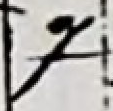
7
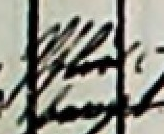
Pfinds„
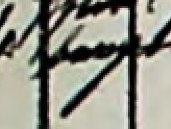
berg
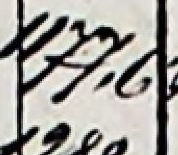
1177,6
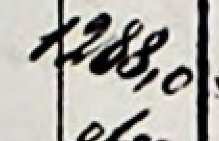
1288,0
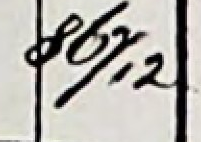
867,2
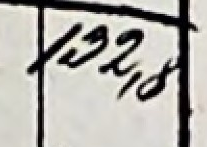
132,8
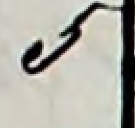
5
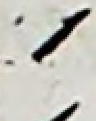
1
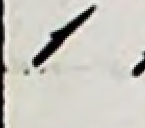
1
